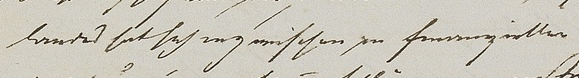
Landes hat sich inzwischen in finanzieller
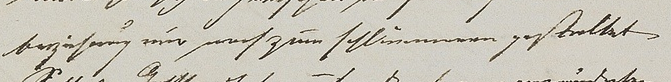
Beziehung nur noch zum schlimmern gestaltet.
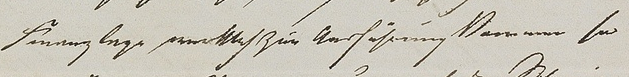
Finanzlage wirklich zur Ausführung kommen so
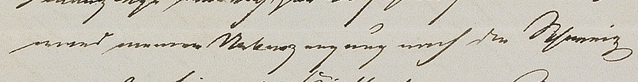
wird meiner Ueberzeugung nach die Schweiz
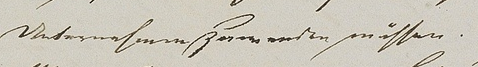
Unternehmen zuwenden müssen.
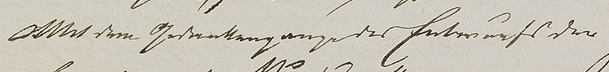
Mit dem Gedankengange des Entwurfs der
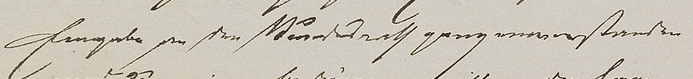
Eingabe an den Bundesrath ganz einverstanden
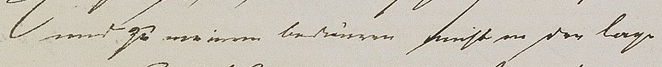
und zu meinem Bedauern nicht in der Lage
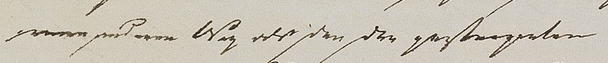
einen anderen Weg als den der gesteigerten
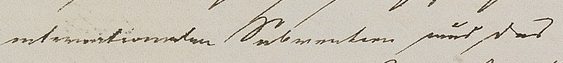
internationalen Subvention und des
